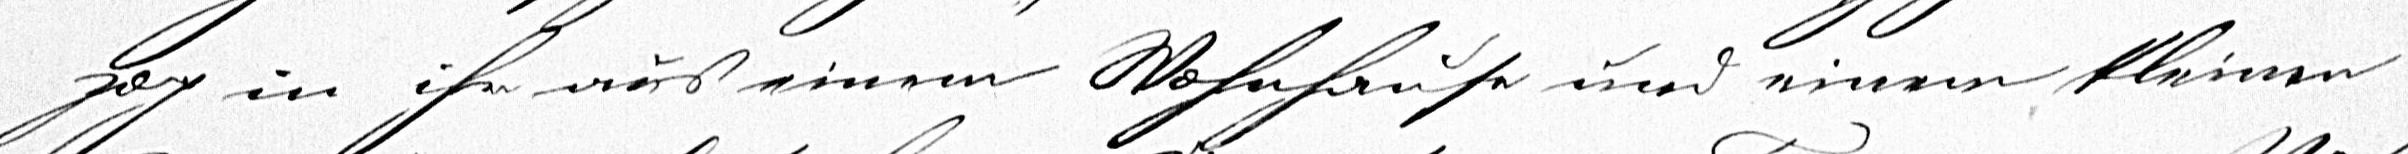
zog in ihr auseinem Wohnhause und einem kleinen
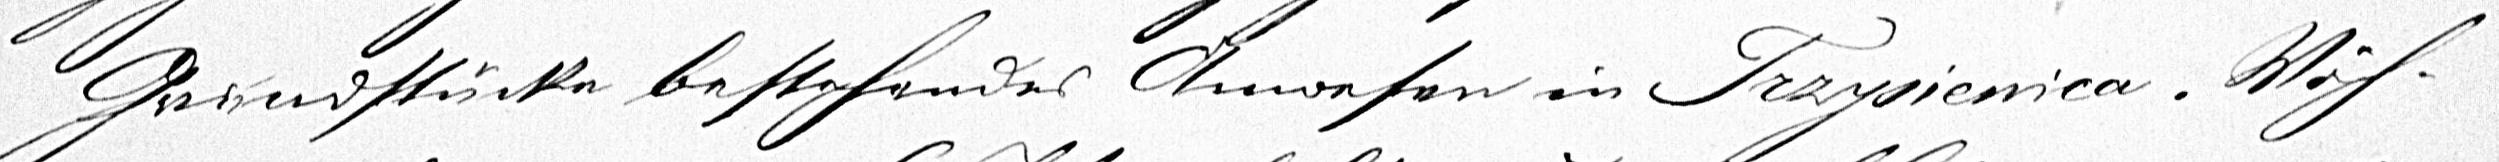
Grundstücke bestehendes Anwesen in Trzysienica. Wäh¬
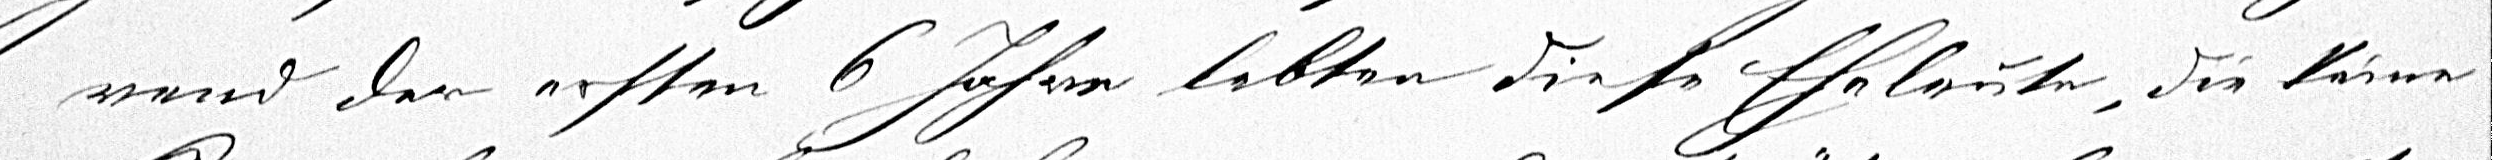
rend der ersten 6 Jahre lebten diese Eheleute, die keine
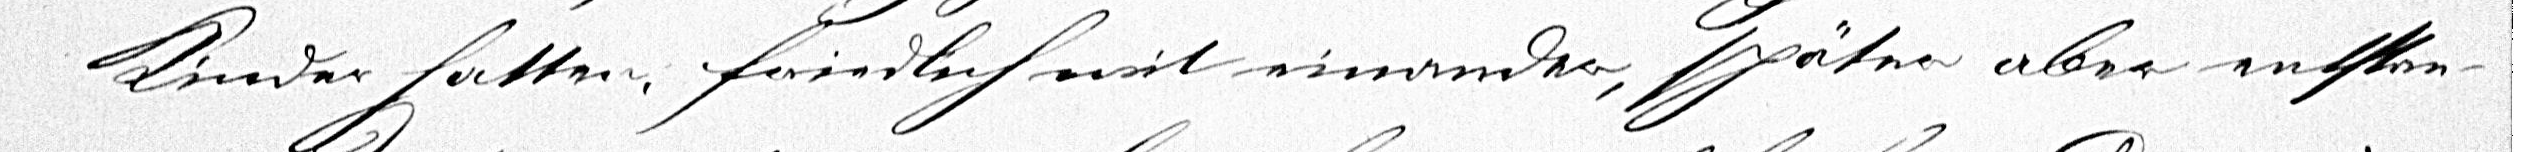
Kinder hatten,.Ffriedlich mit einander, später aber entstan¬
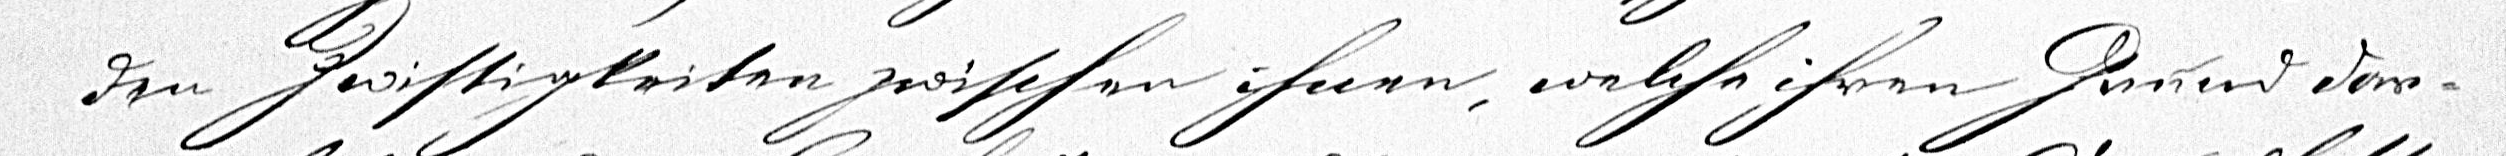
den Zwistigkeiten zwischen ihnen, welche ihren Grund dar¬
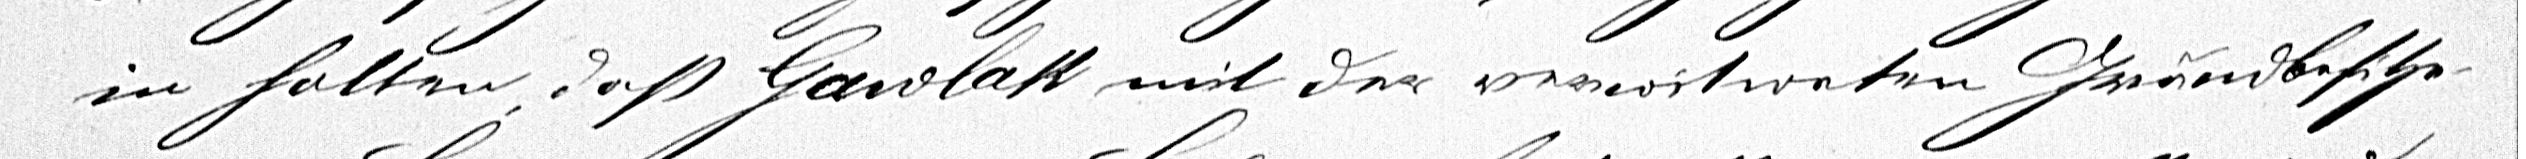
in halten, daß Gawlak mit der verwitweten Grundbesitzer¬
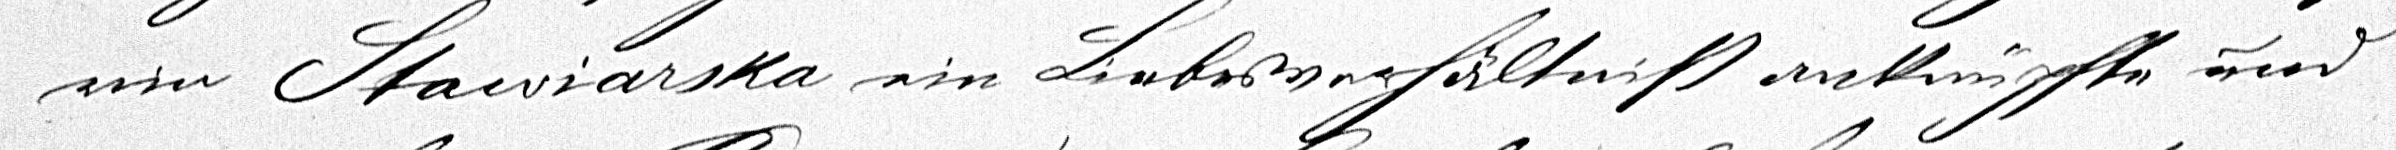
in StawiarskaeinLiebesverhältniß anknüpfte und
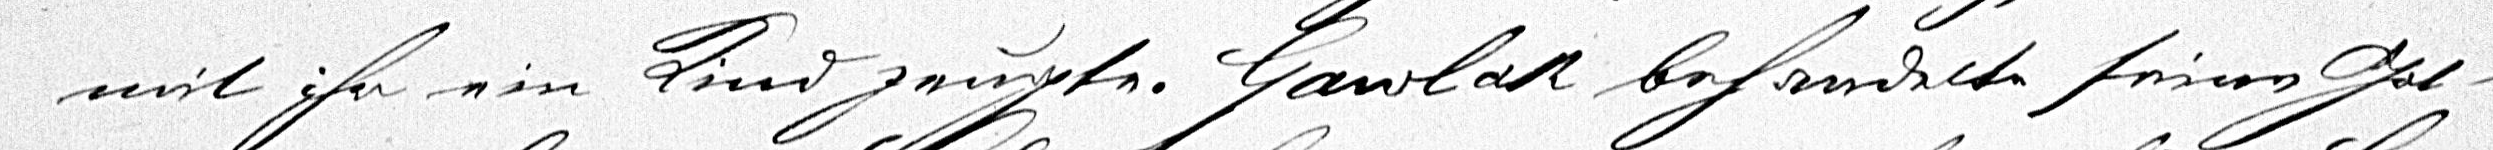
mit ihr ein Kind zeugte. Gawlak behandelte seine Gat¬
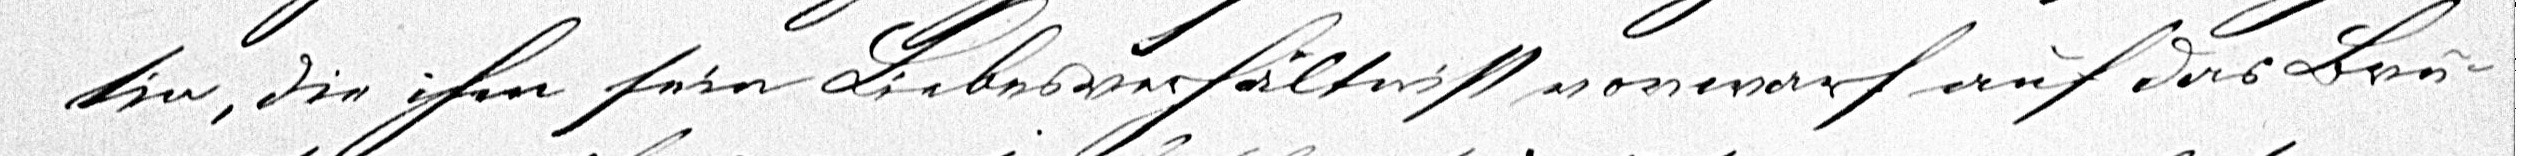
tin, die ihm sein Liebesverhältniß vorwarf auf das Bru¬
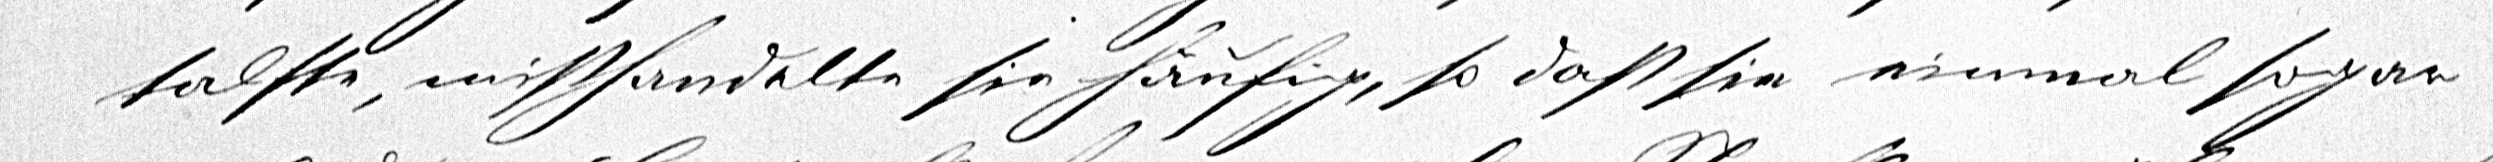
talste, mißhandelte sie häufig, so daß sie einmal sogar
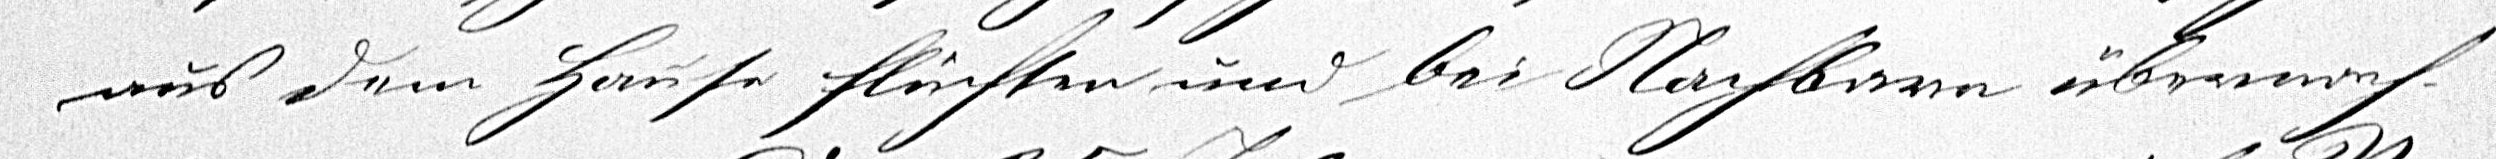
aus dem Hause flüchten und bei Nachbarn übernach¬
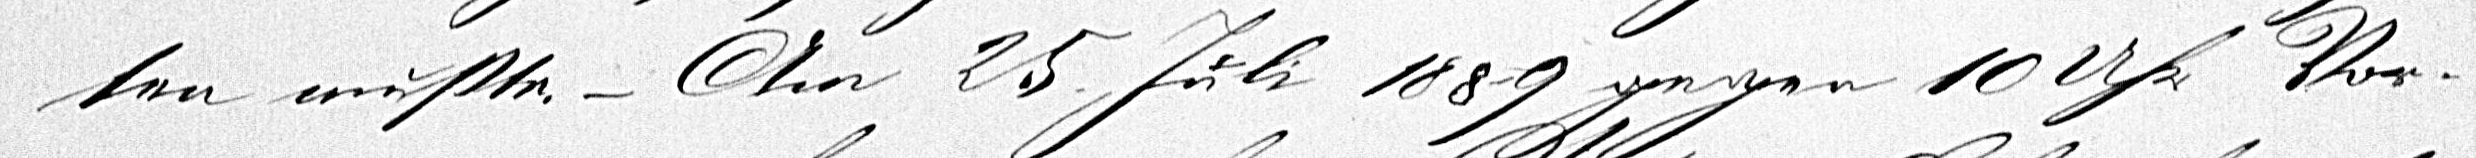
ten mußte.- Am 25. Juli 1889 gegen 10 Uhr Vor¬
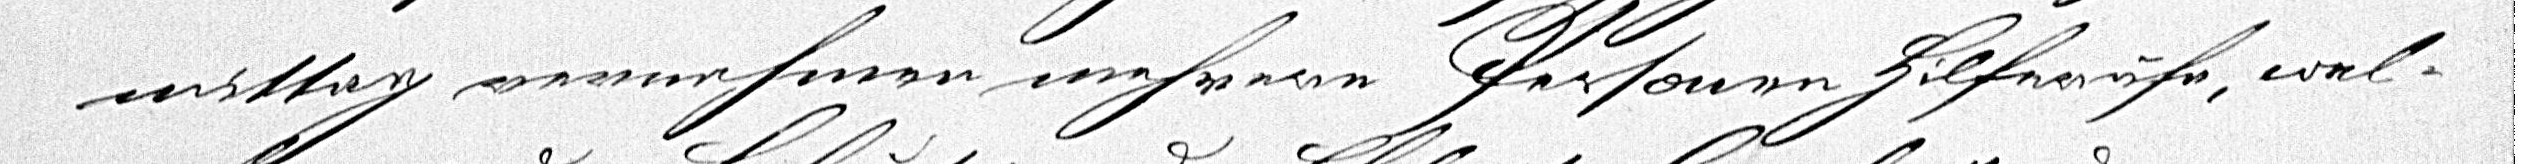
mittag vernahmen mehrere Personen Hilferufe, wel¬
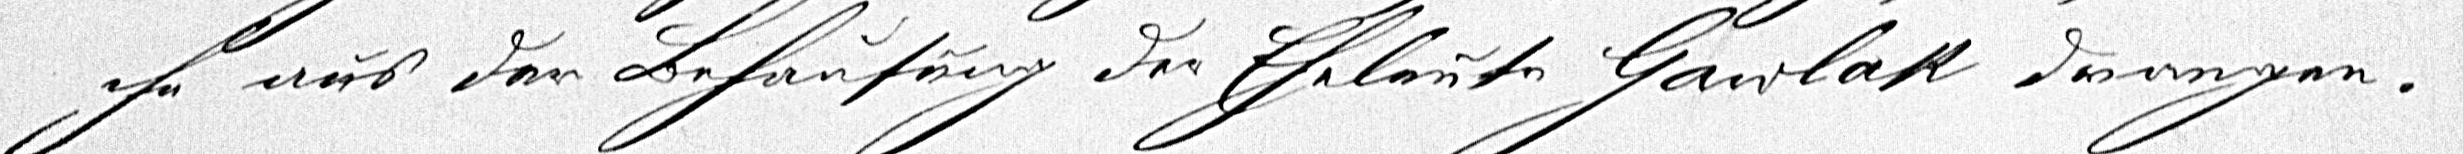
che aus der Behausung der Eheleute Gawlak drangen.
